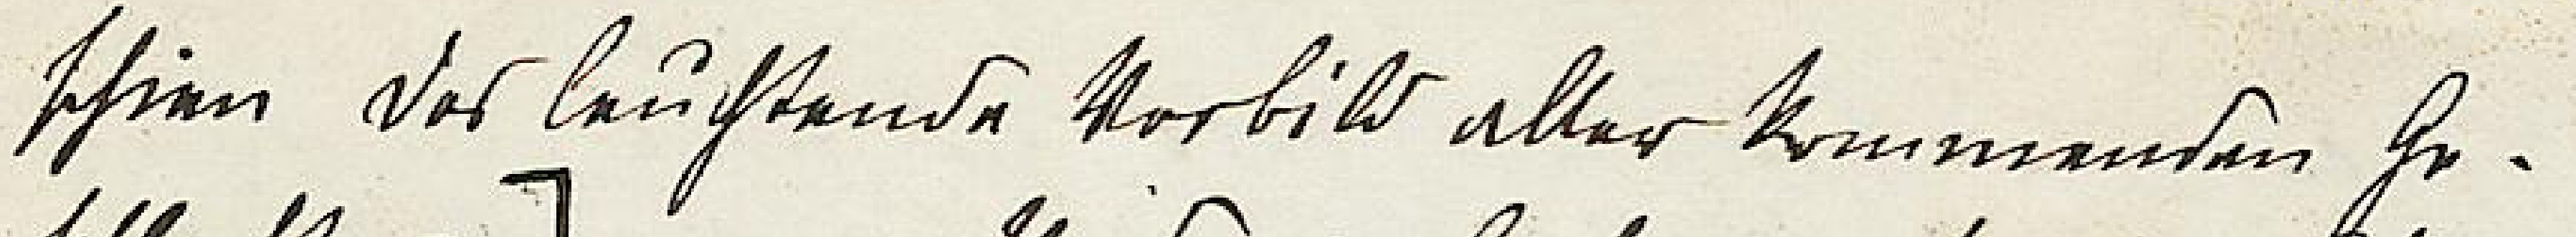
schien das leuchtende Vorlbild aller kommenden Ge¬
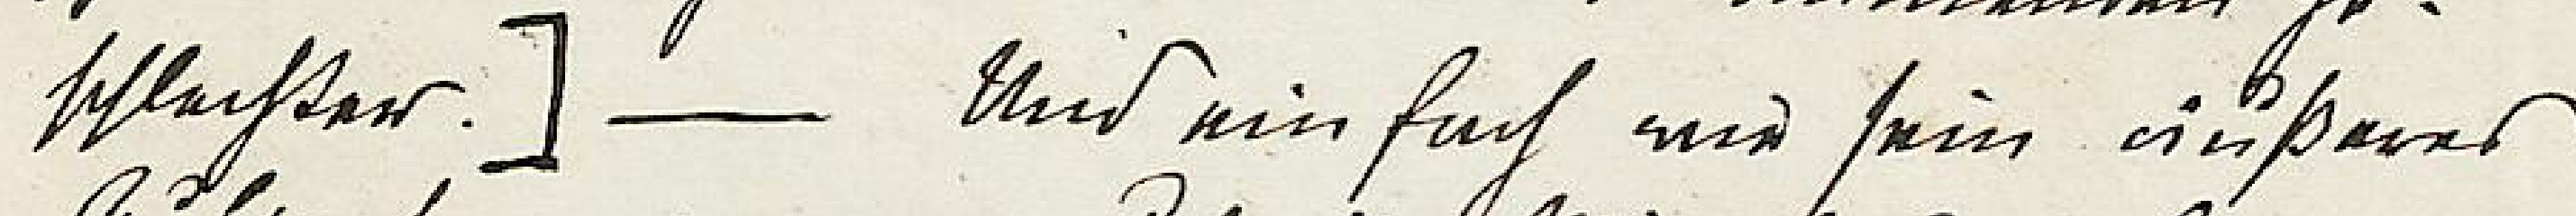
schlechter. ] _ Und einfach wie sein äußeres
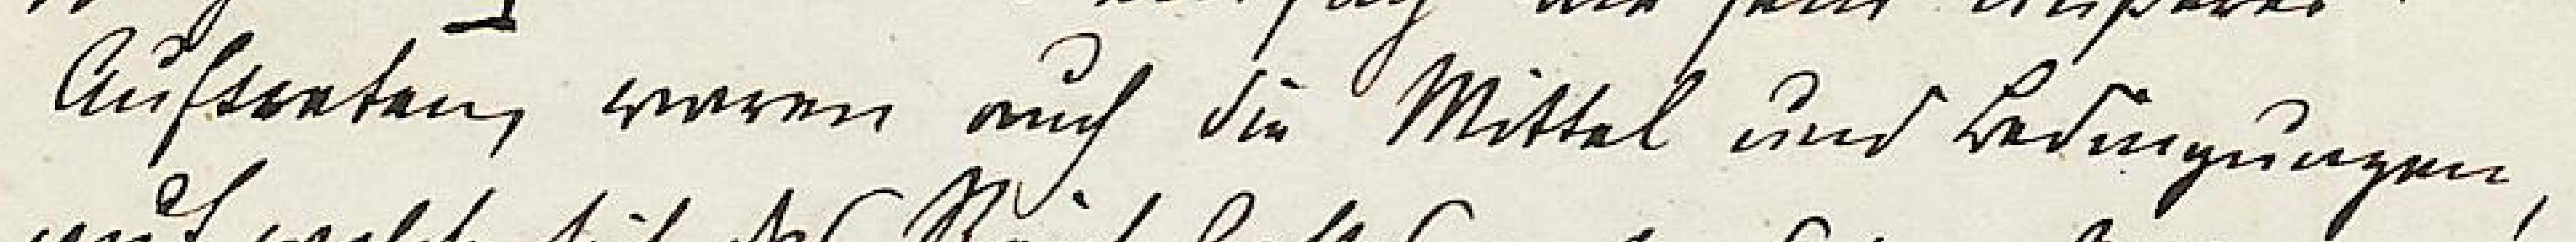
Aufreten waren auch die Mittel und Bedingungen,
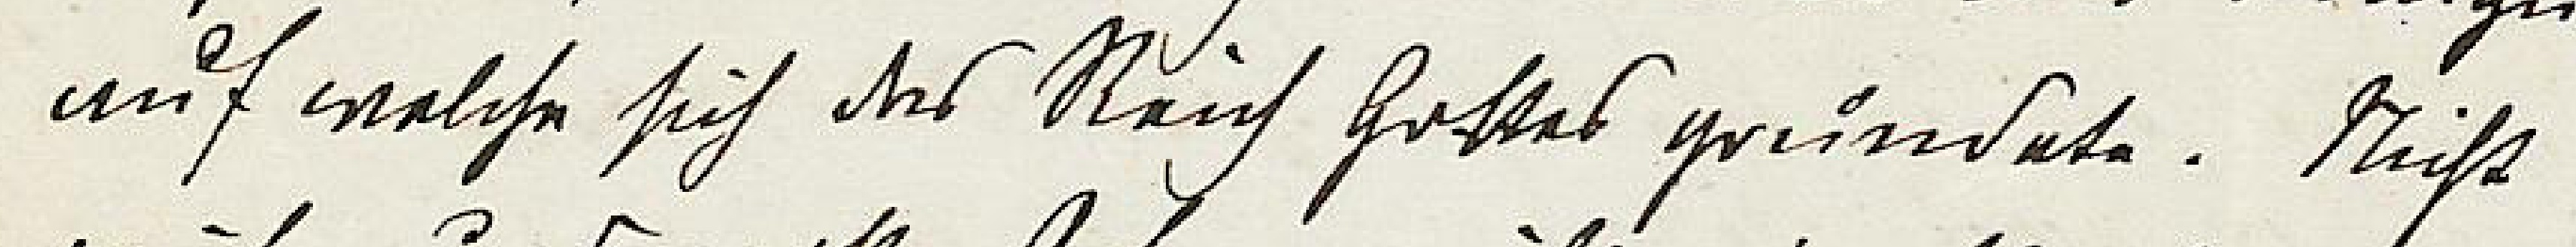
auf welche sich das Reich Rottes gründete. Nicht
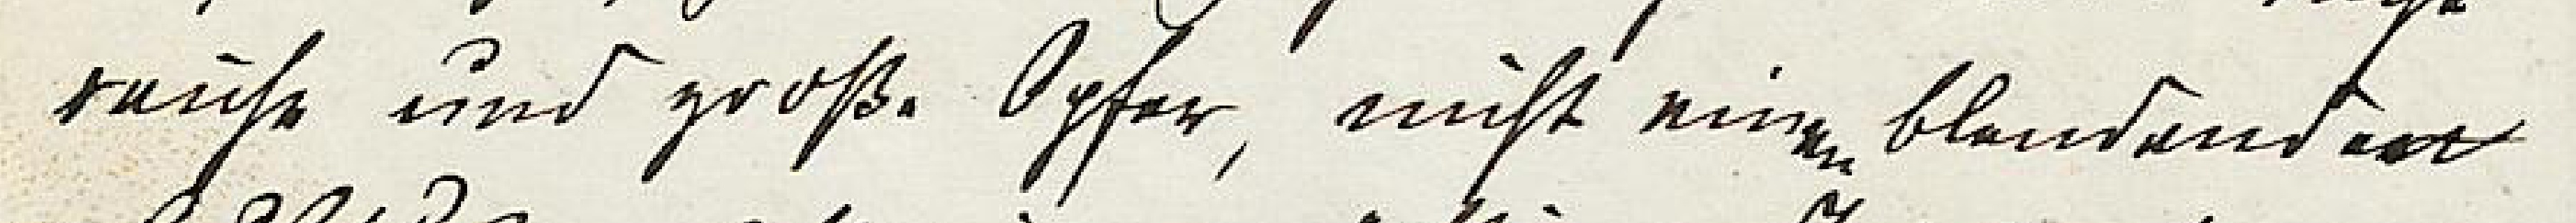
reiche und große Opfer, nicht einen blendenden
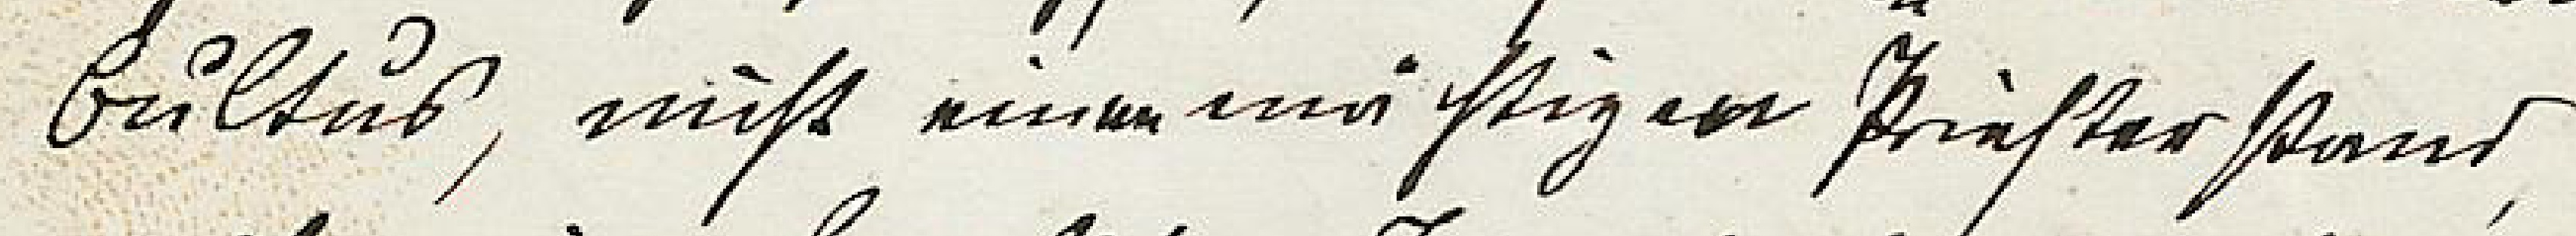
Cultus, nicht einen mächtigen Priesterstand,
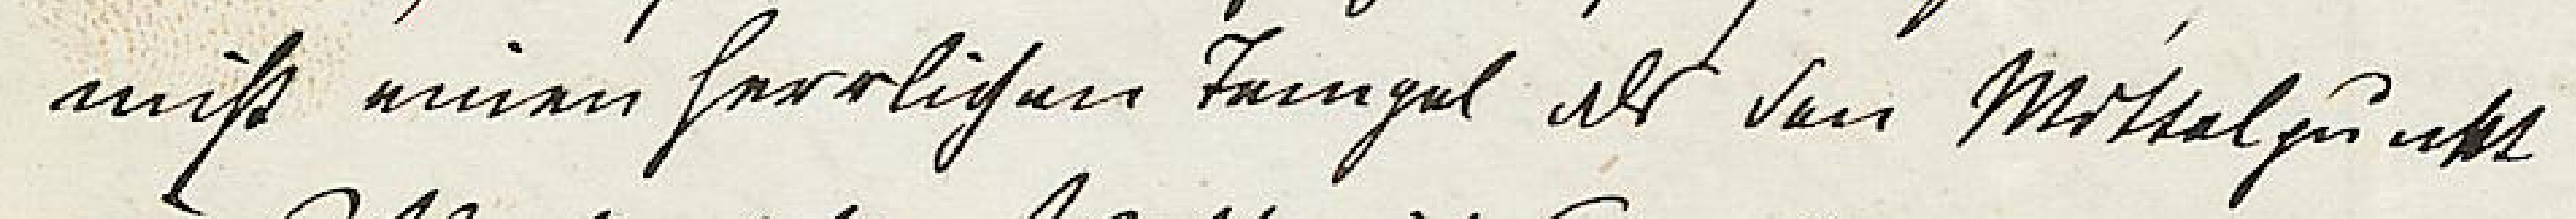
nicht einen herrlichen Tempel als den Mittelpunkt
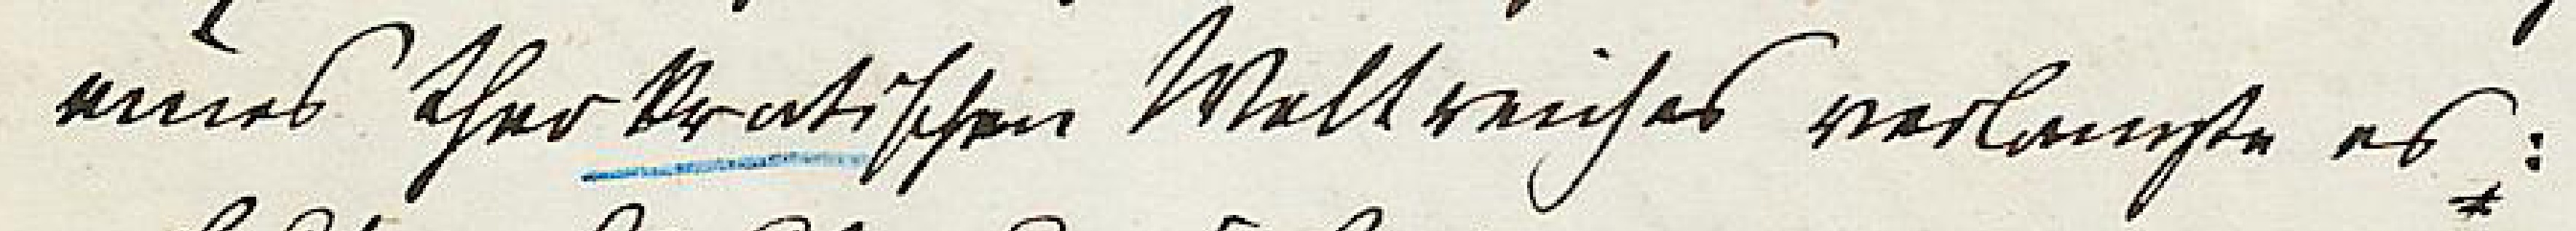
eines theokratischen Weltreiches verlangte es:
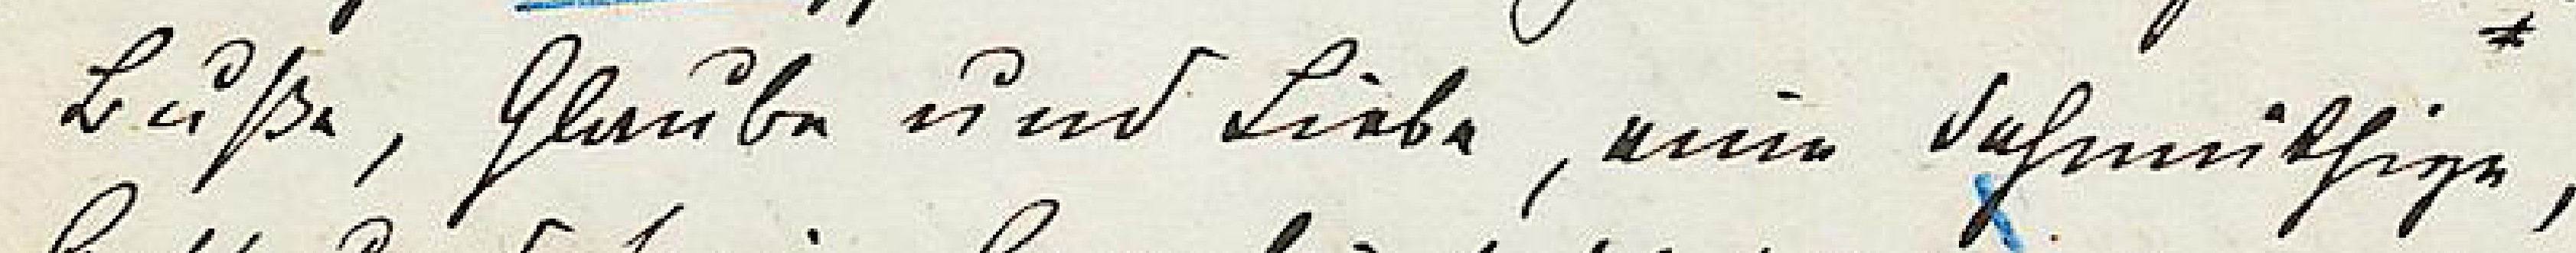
Buße, Glaube und Liebe, einen dehmüthigen,
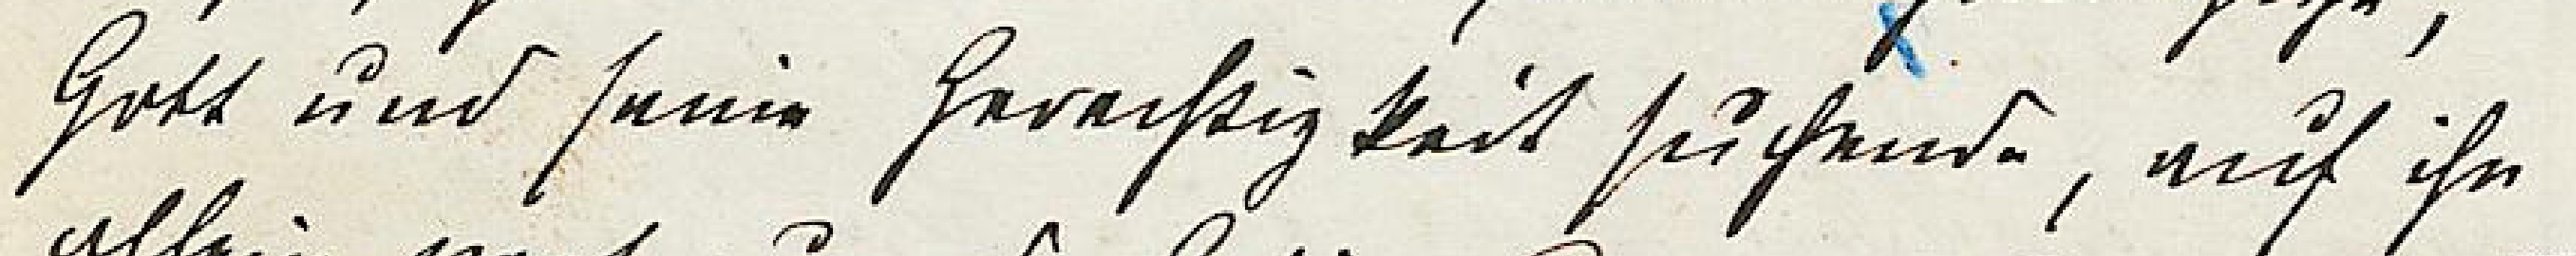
Gott und seine Gerechtigkeit suchende, auf ihn
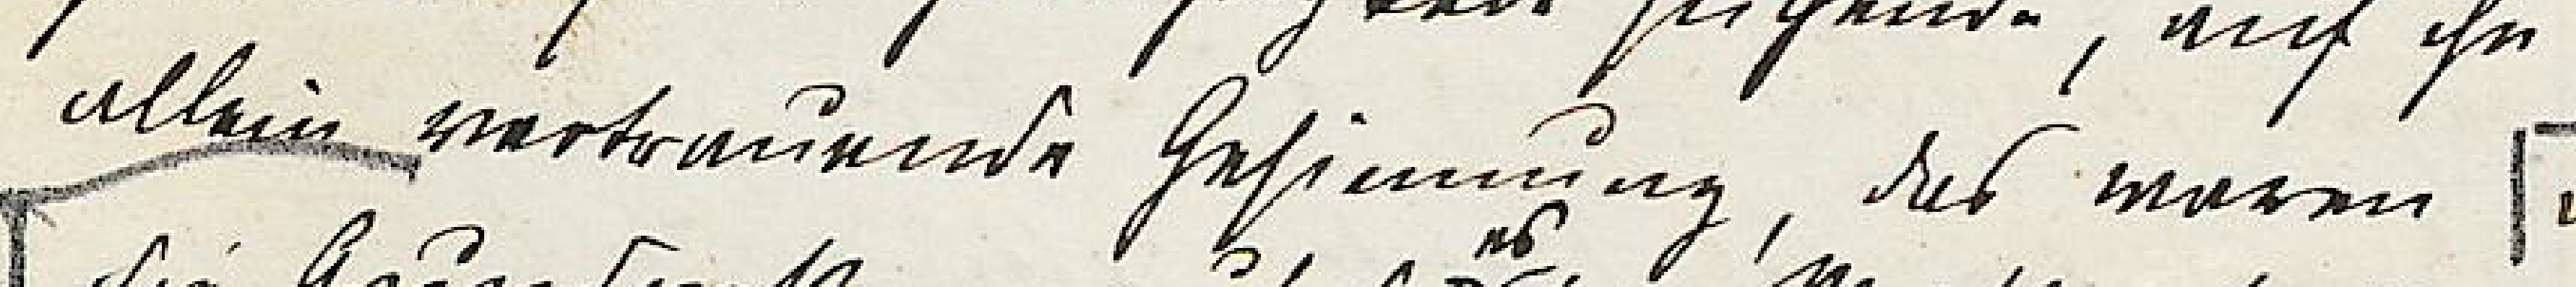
allein vertrauende Gesinnung, das waren
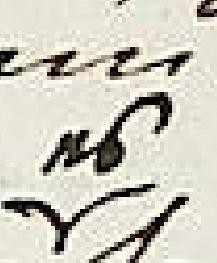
es
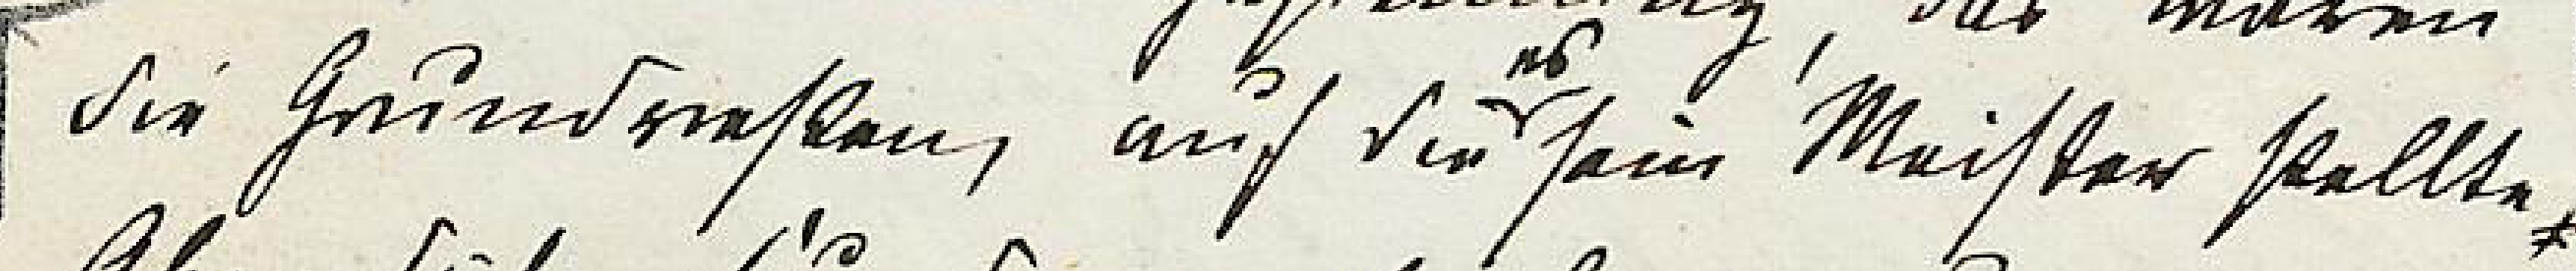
die Grundvesten, auf die sein Meister stellte
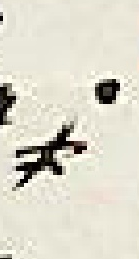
,
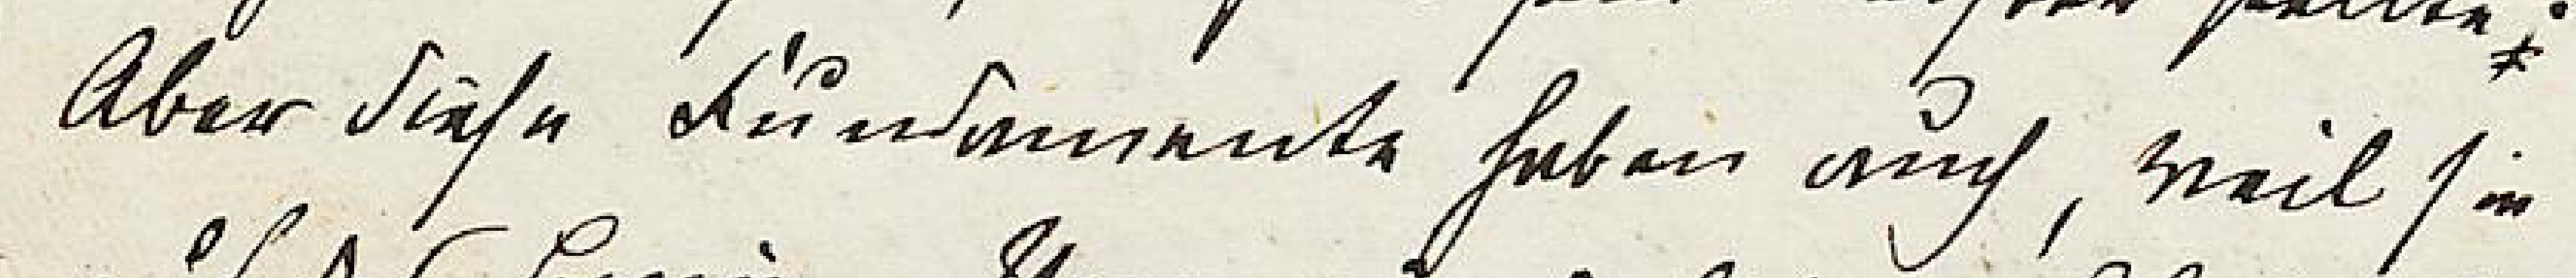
Aber diese Fundamente haben auch, weil sie
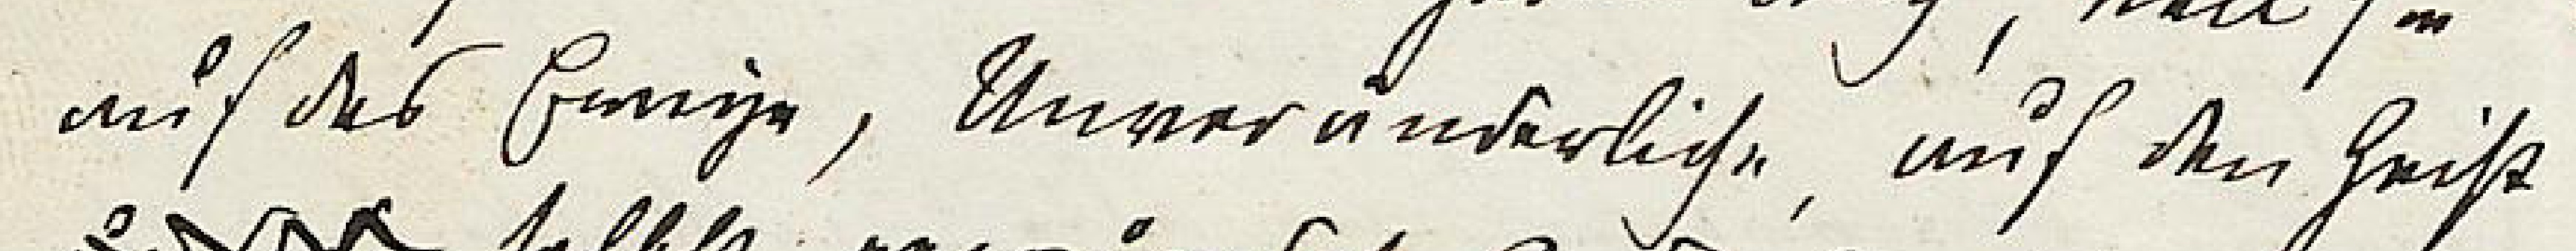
auf der Ewigen, Unveränderliche, auf den Geist
